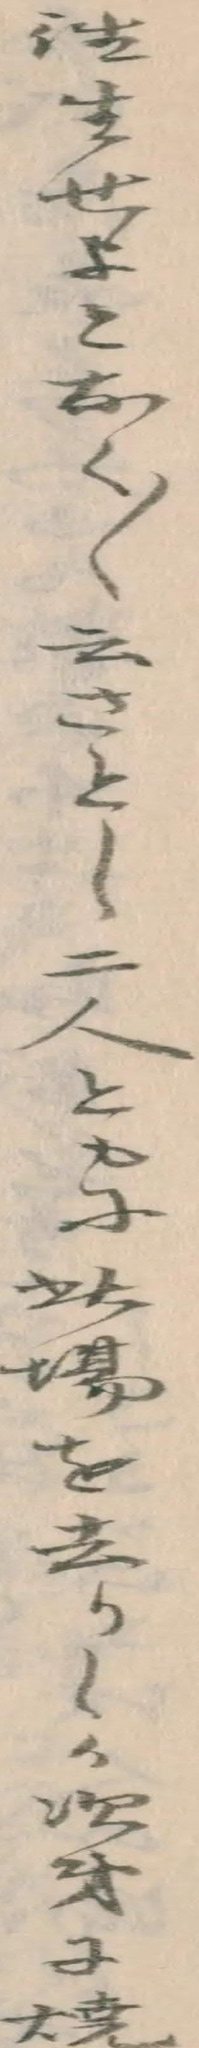往生せよとなく〳〵云さとし二人ともに此場を去りしか次第に焼
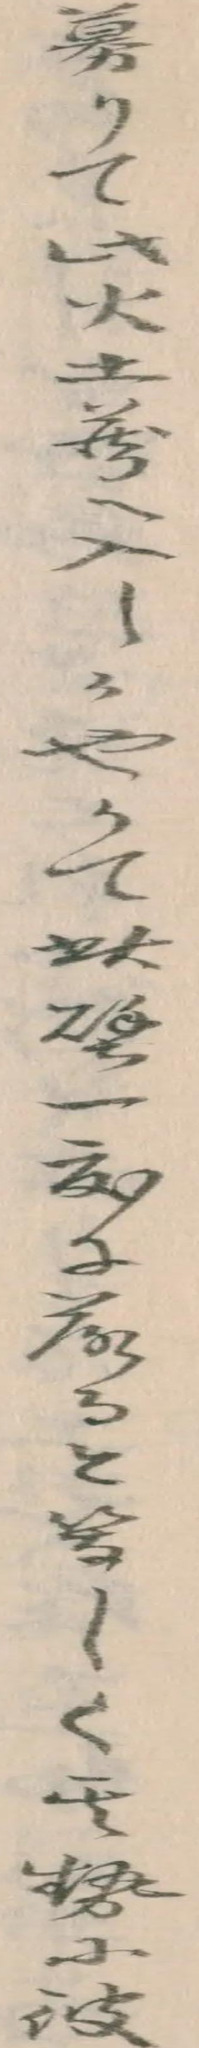募りて此火土蔵へ入しかやかて此壁一度に落ると等しく其勢に彼
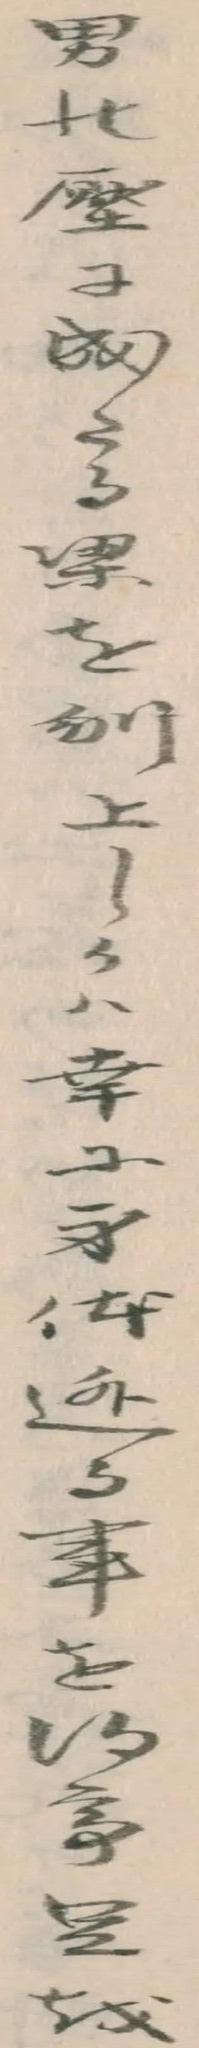男の圧に成たる梁を刎上しかは幸に身体逃る事を得て足を
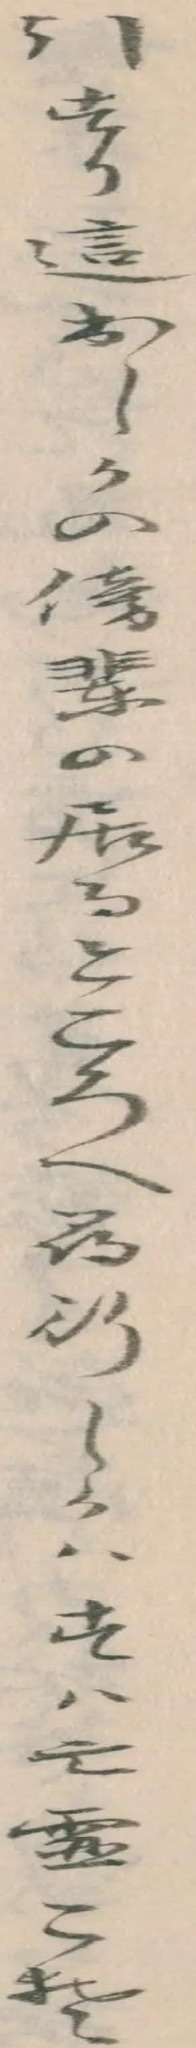引すり這出しかの傍輩の居るところへ尋行しかはすは亡霊こそ
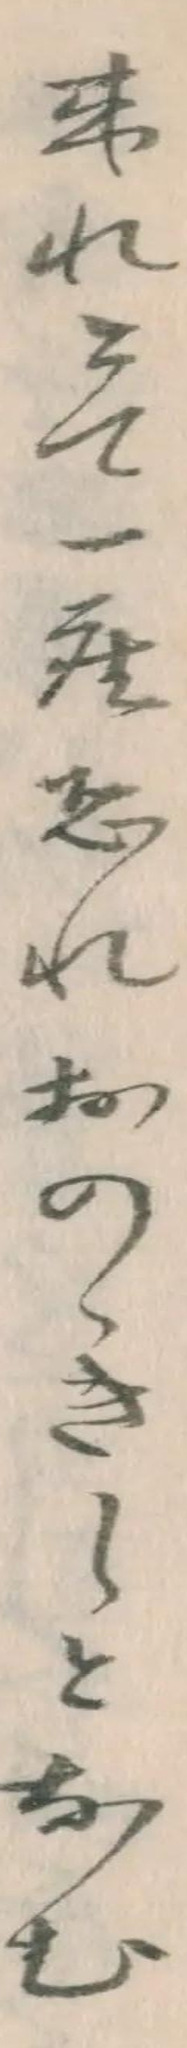来れとて一座恐れおのゝきしとなむ
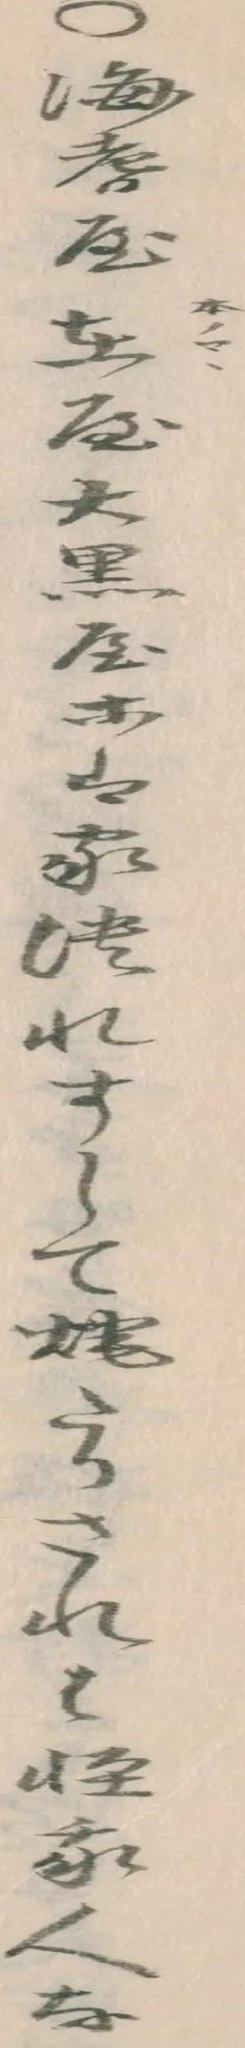〇海老屋在屋大黒屋等は家潰れすして焼たりされは怪我人な
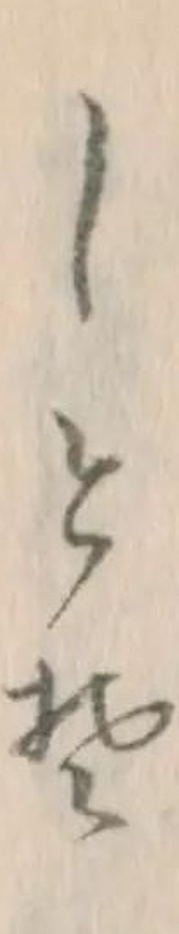しとそ
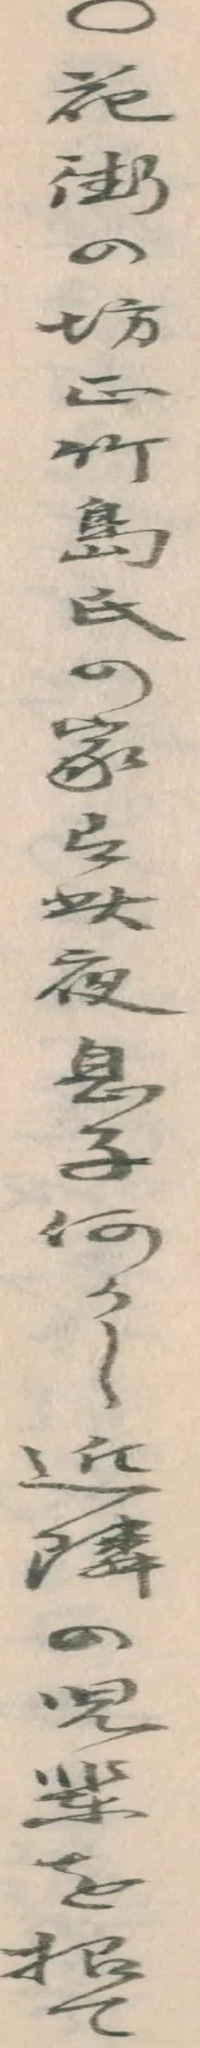〇花街の坊正竹島氏の家は此夜息子何かし近隣の児輩を招て
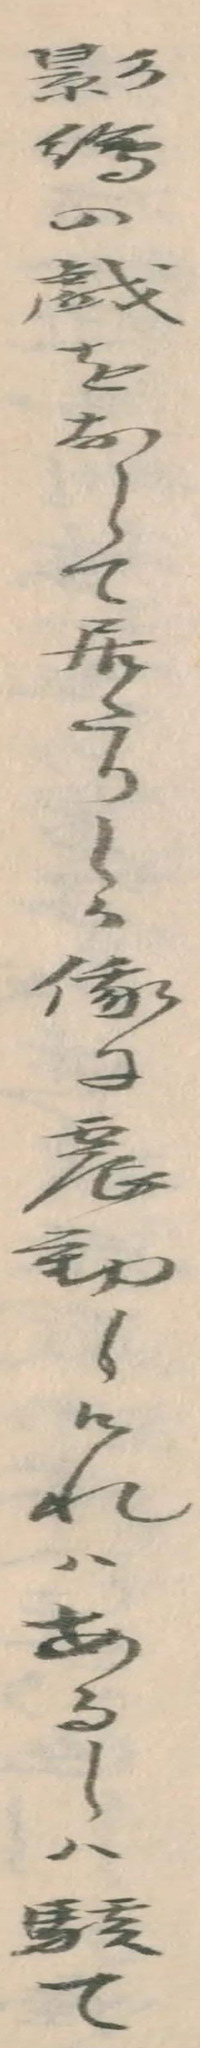影絵の戯をなして居たりしか俄に振動しけれはあるしは駭て

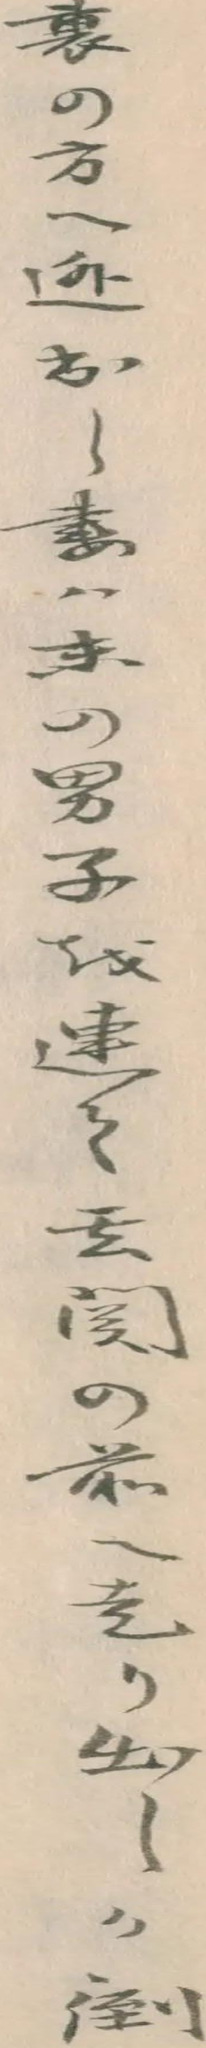裏の方へ逃出し妻は末の男子を連て玄関の前へ走り出しか倒
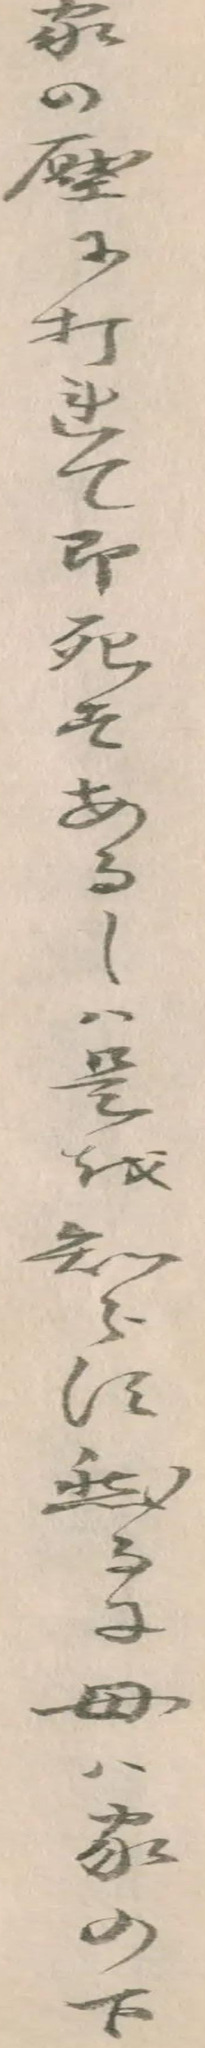家の圧に打れて即死すあるしは是を知らす然るに母は家の下
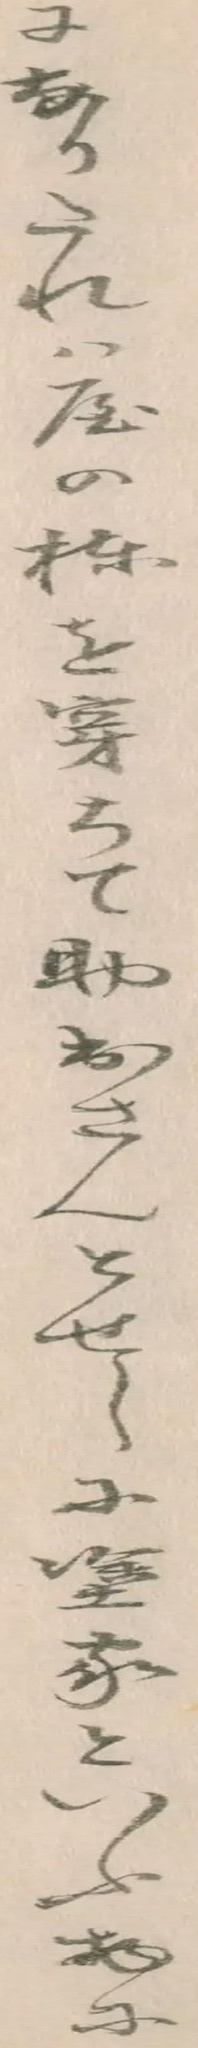になりたれは屋の棟を穿ちて助出さんとせしに塗家といふ物に
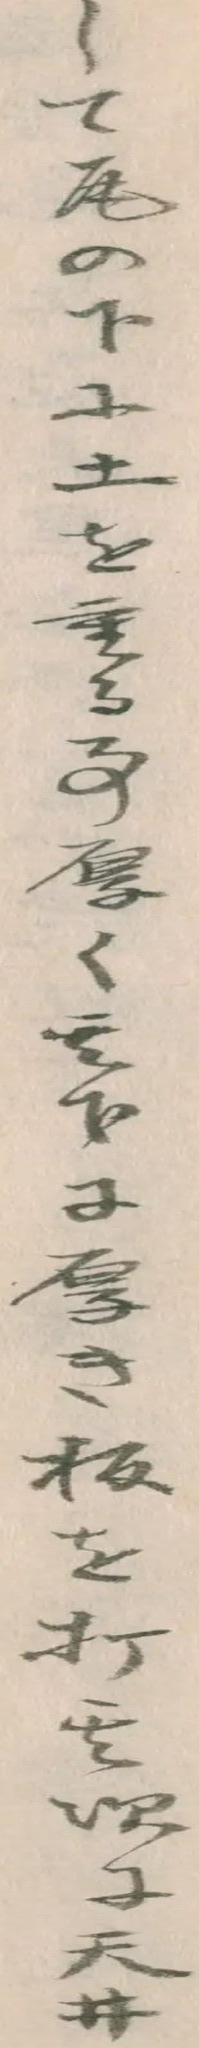して瓦の下に土を重る事厚く其下に厚き板を打其次に天井
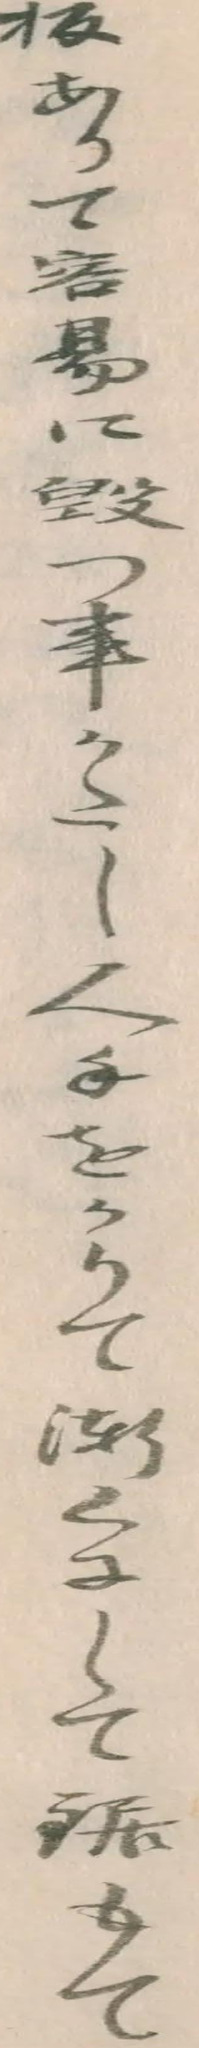板ありて容易に毀つ事かたし人手をかりて漸くにして鋸もて
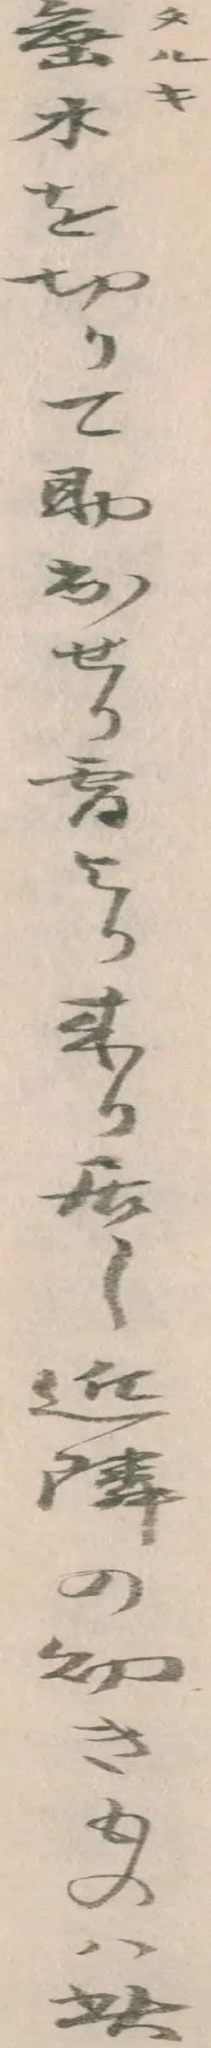垂木を切りて助出せり宵より来り居し近隣の幼きものは此
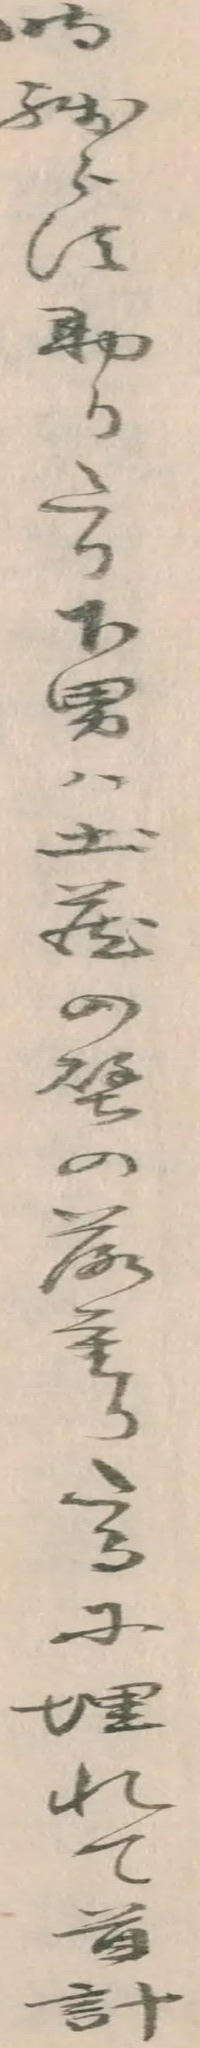時残らす助りたり下男は土蔵の壁の落重りたるに埋れて首計
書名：地災撮要. 巻10(地震之部) 上,下
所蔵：国立国会図書館 National Diet Library, JAPAN
